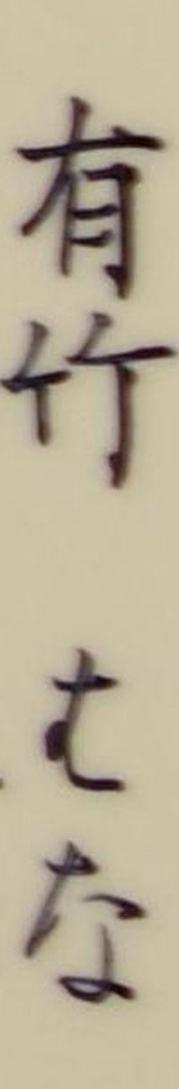有竹はな
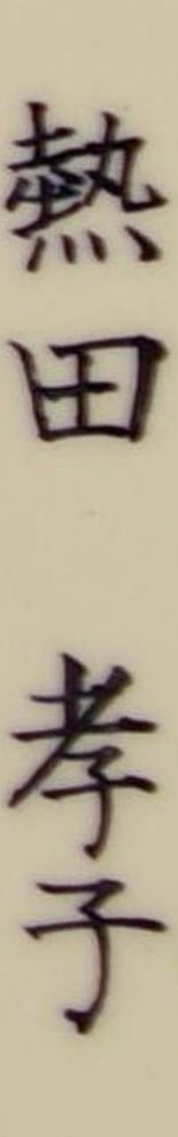熱田孝子
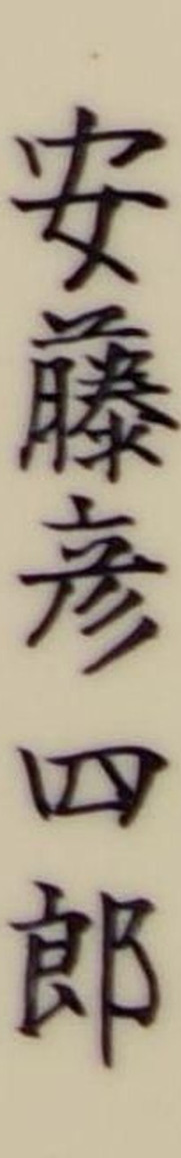安藤彦四郎
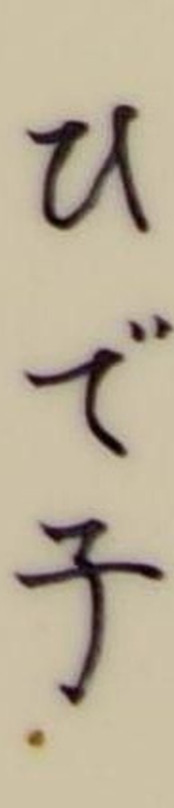ひで子
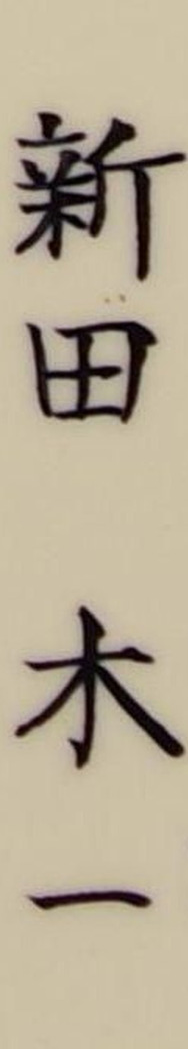新田木一
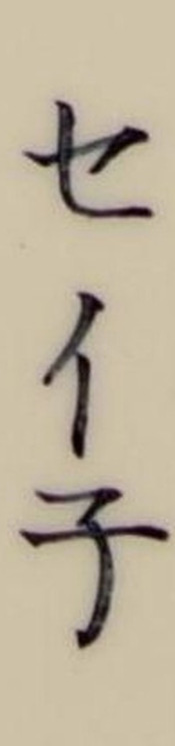セイ子
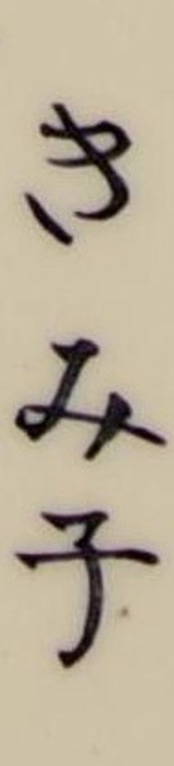きみ子
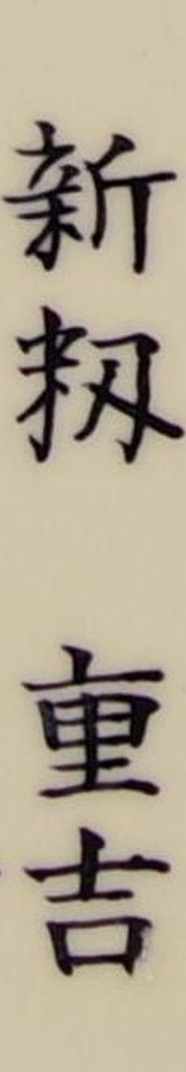新籾重吉
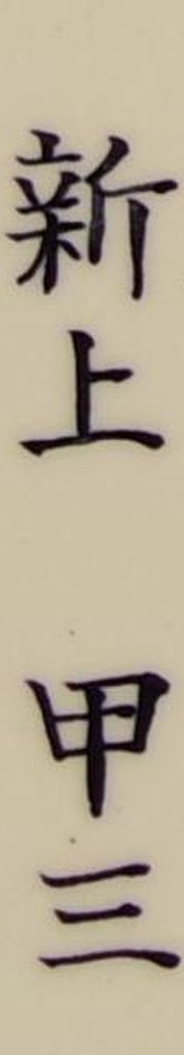新上甲三
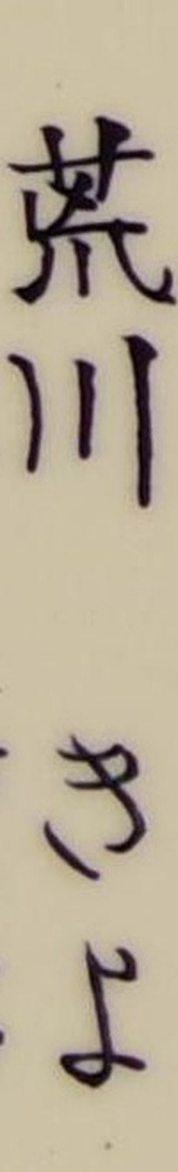荒川きよ

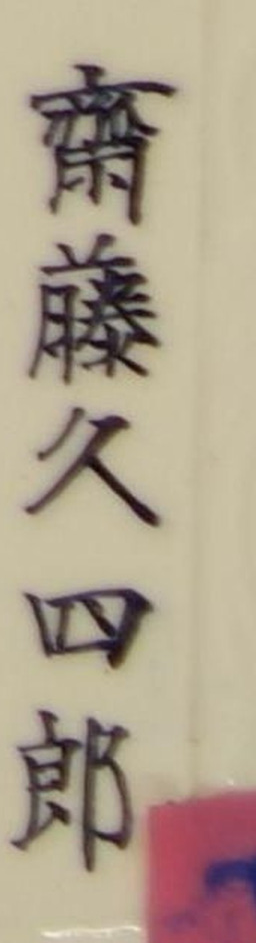斎藤久四郎
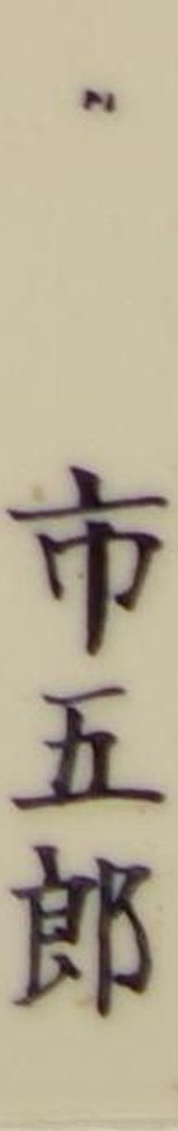市五郎
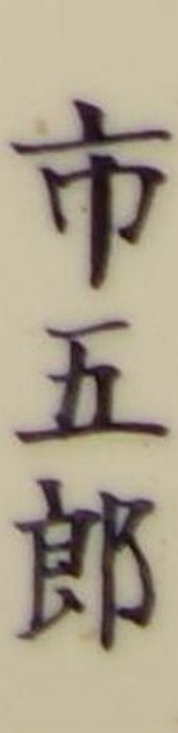市五郎
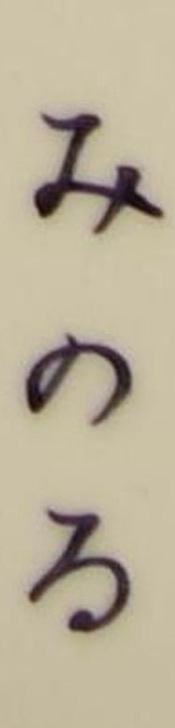みのる
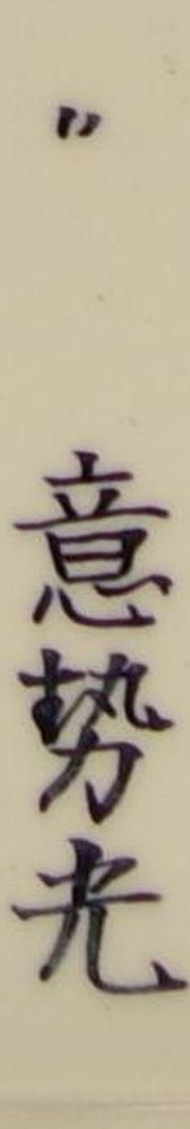意勢光
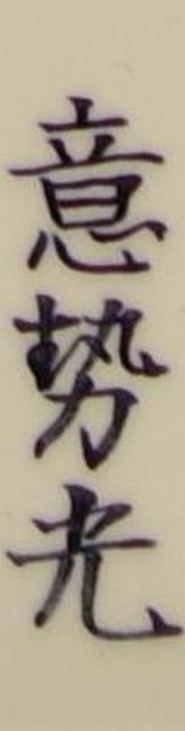意勢光
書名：E~L
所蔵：高野山金剛峯寺
